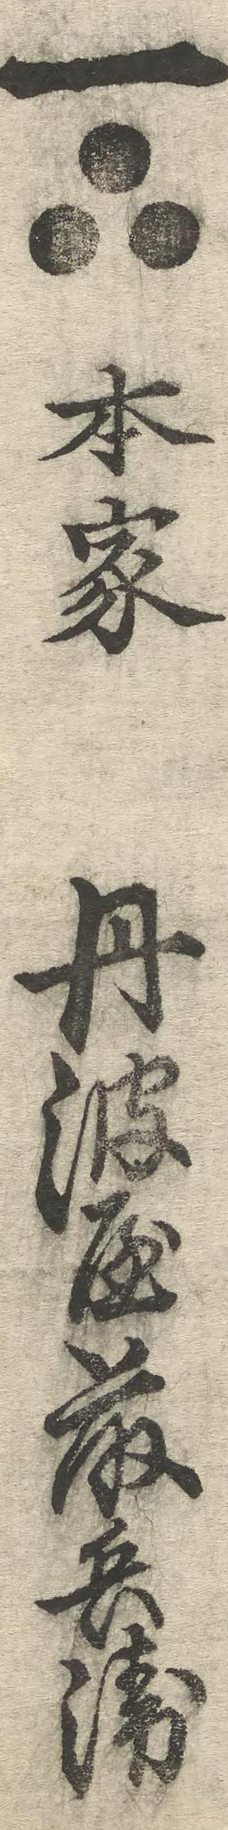本家丹波屋藤兵衛
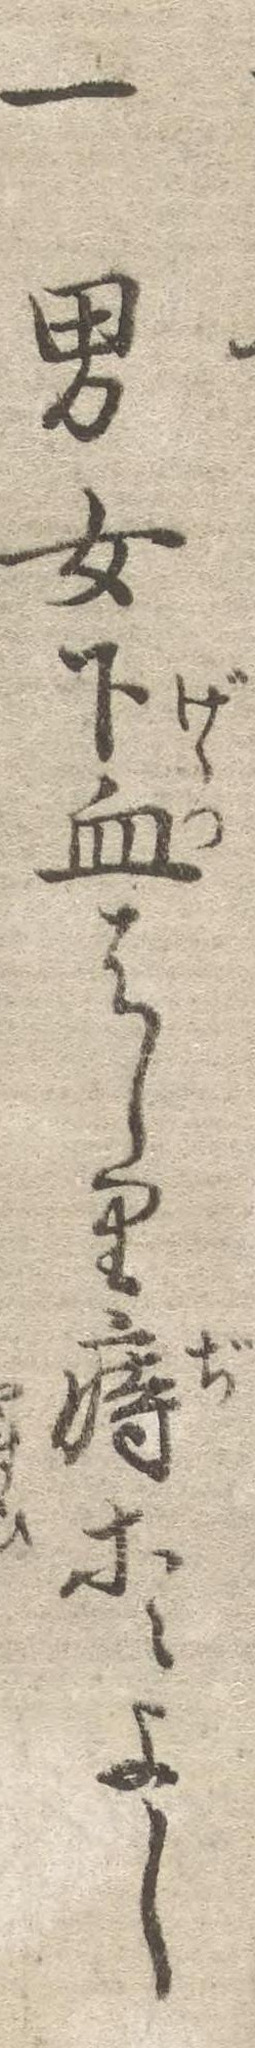一男女下血はしり痔等によし
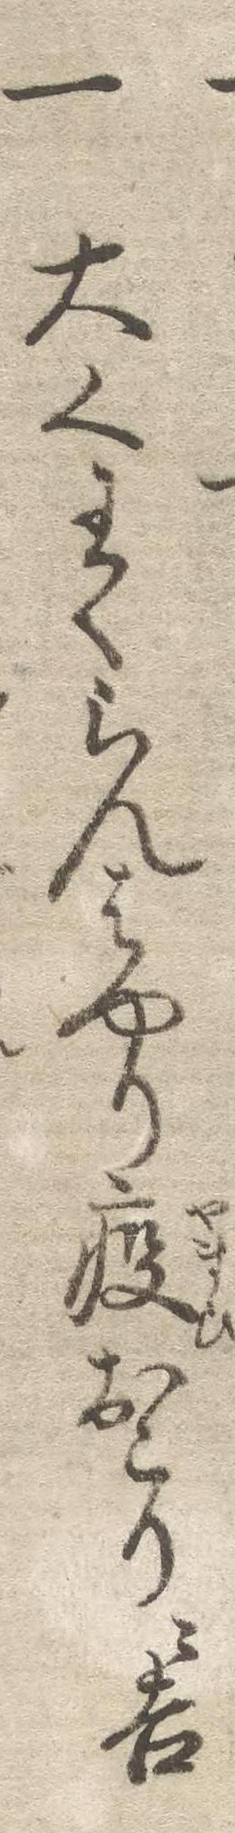一大くわくらんはやり疫おこりに吉
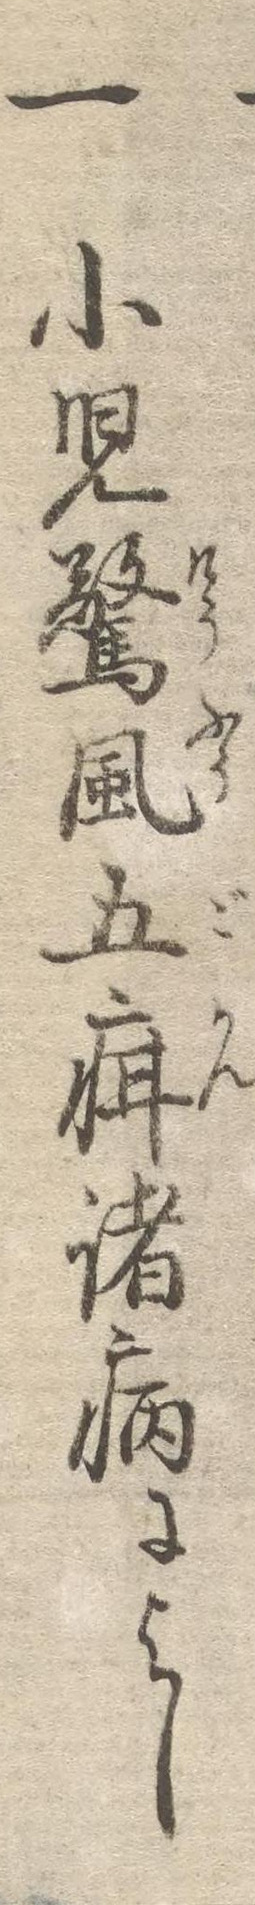一小児驚風五疳諸病によし
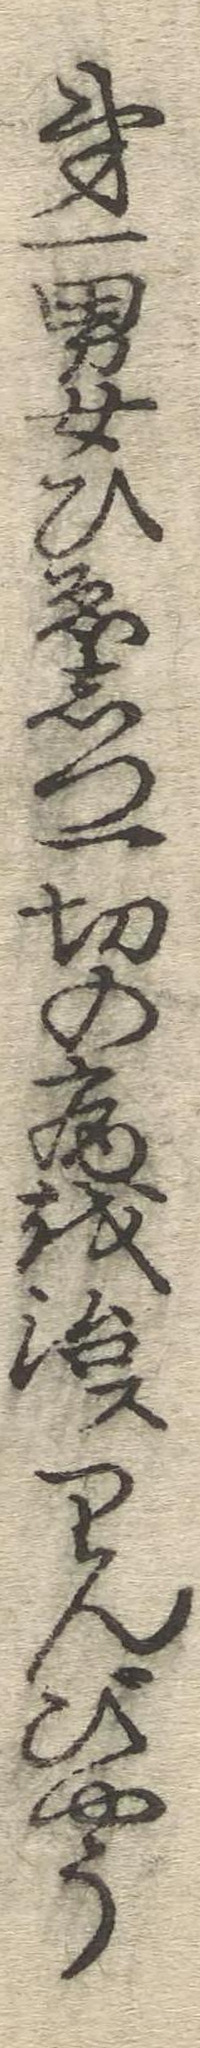第一男女ひゑしつ一切の病を治すりんびやう
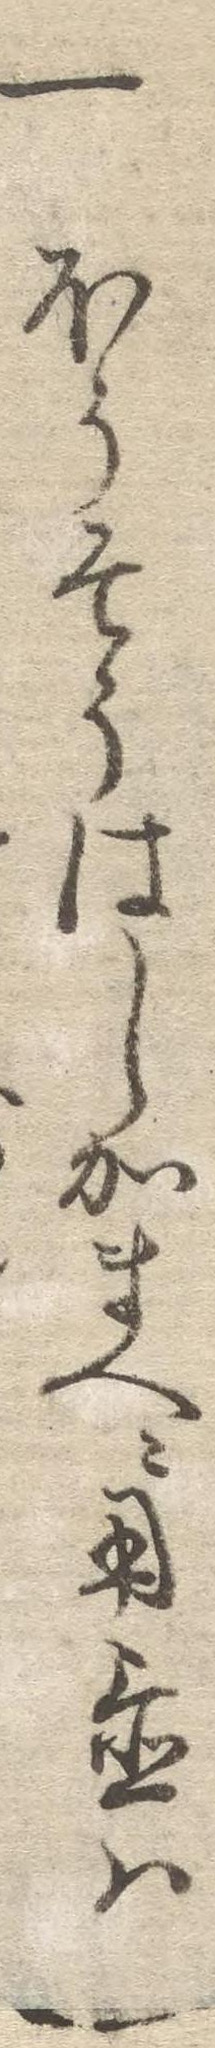一ほうそうはしかまへに用置は
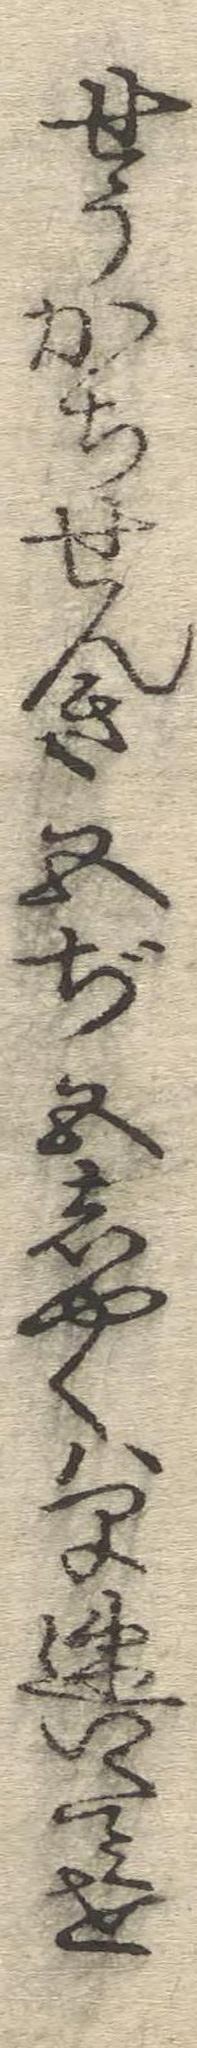せうかちせんき五じ五しやくは早速いたみを
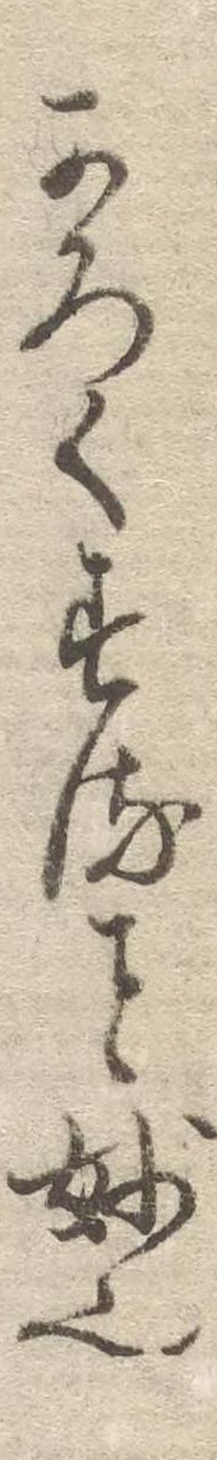かろくすること妙也
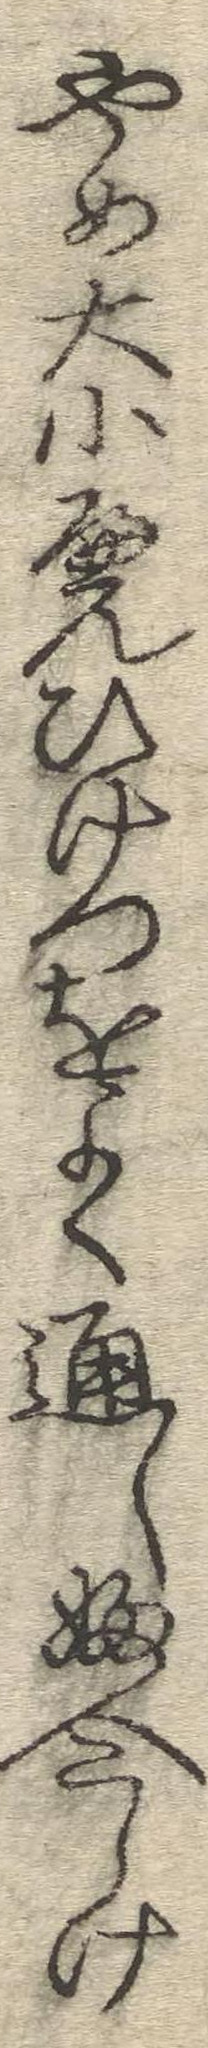やめ大小へんひけつをよく通し婦人こしけ
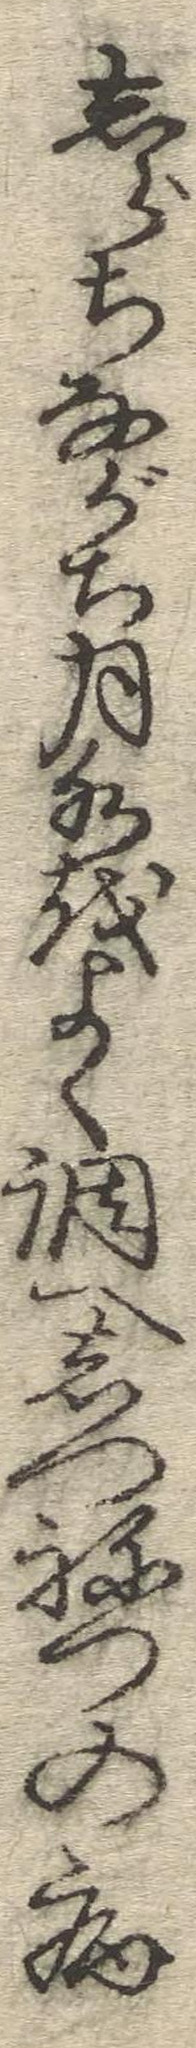しらちながち月水をよく調へしつねつの病
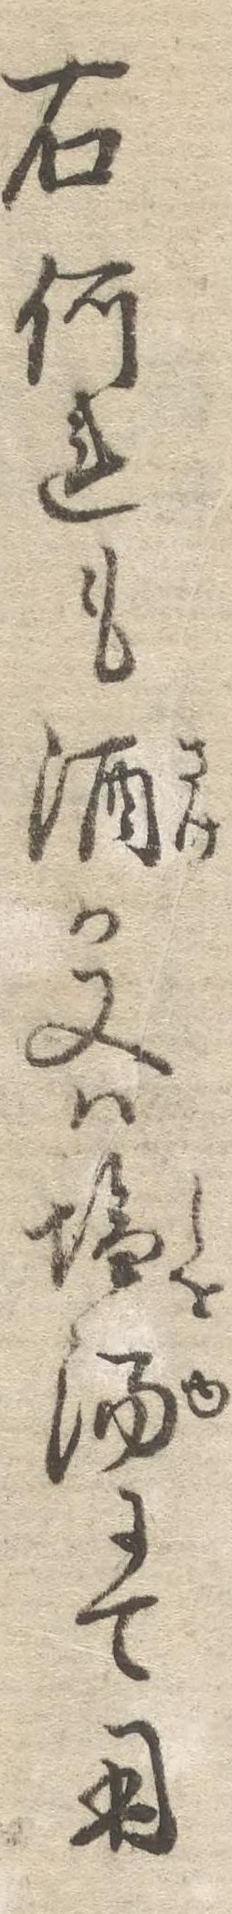右何れも酒か又は塩湯にて用
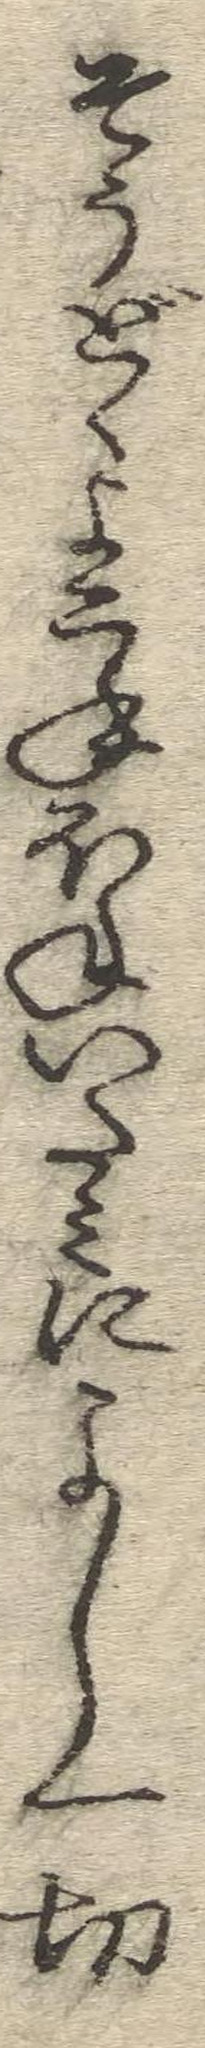そうどくよこねほねいたみによし一切
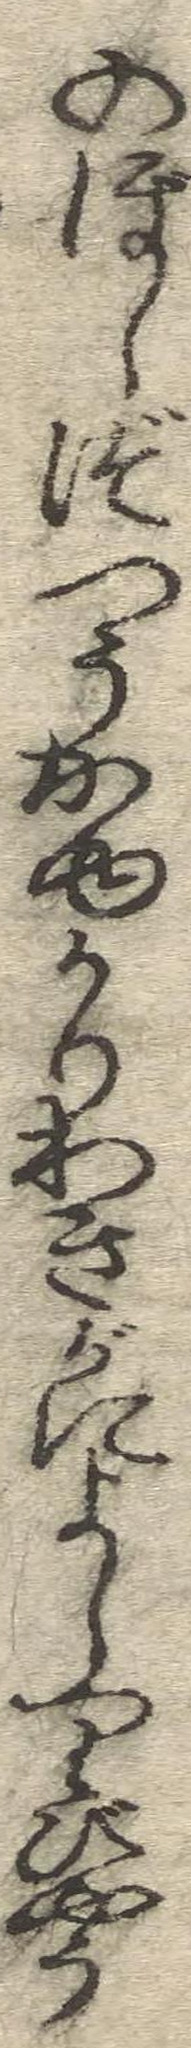のぼしづつうかゆかりわきがによしりびやう
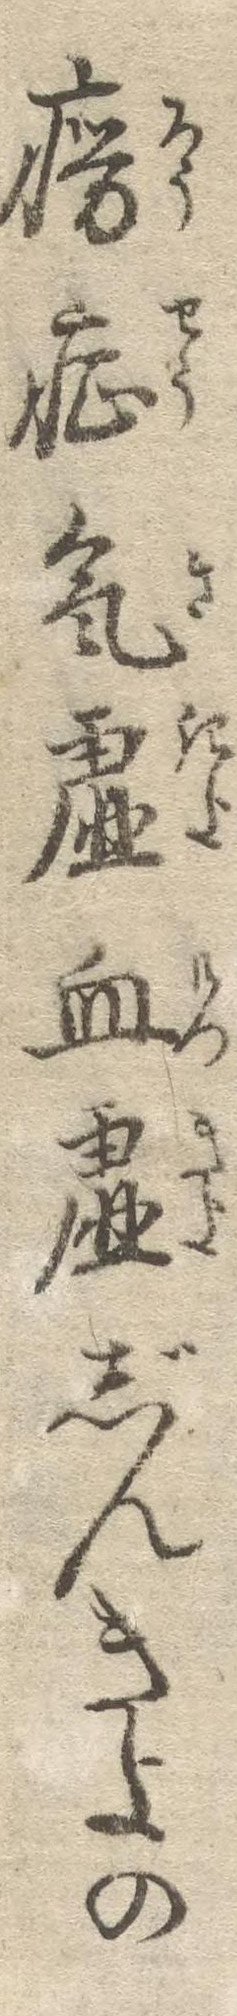癆症気虚血虚じんきよの
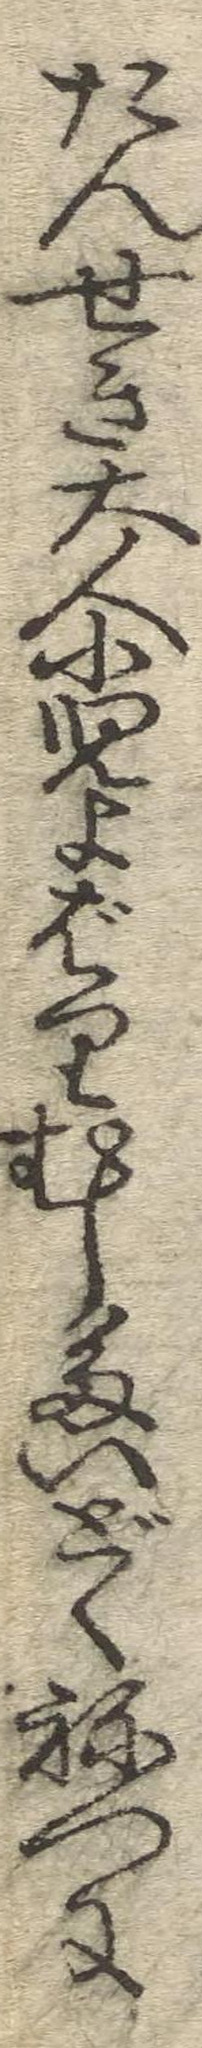たんせき大人小児よばりむしたいどくねつに
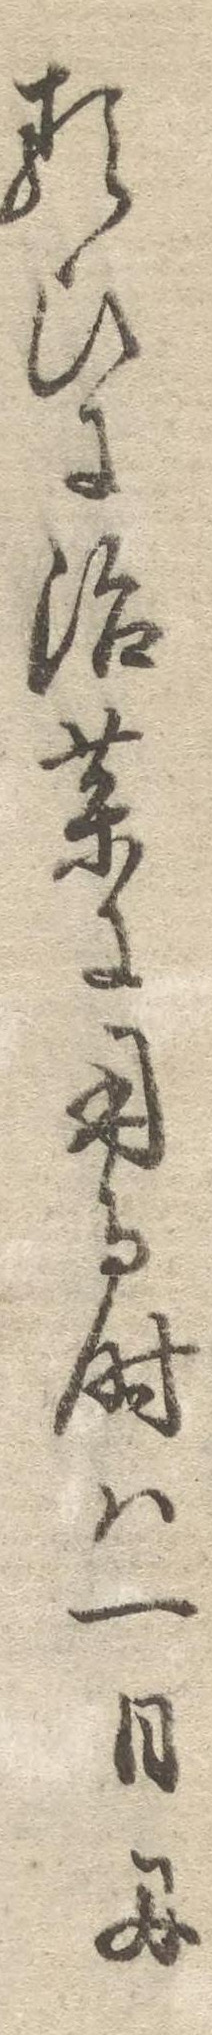類ひに治薬に用る時は一日に
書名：浪華薬種問屋能書張交帖. 二
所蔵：国立国会図書館 National Diet Library, JAPAN
